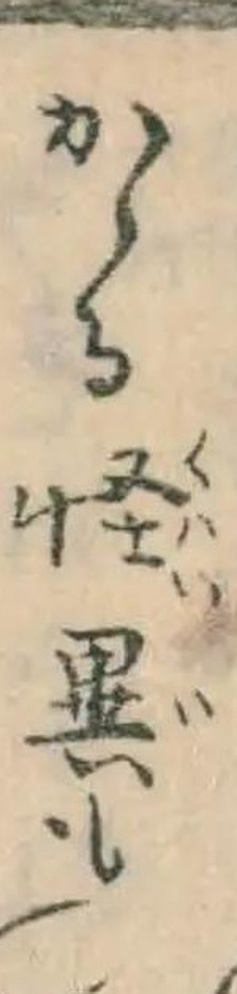かゝる怪異も
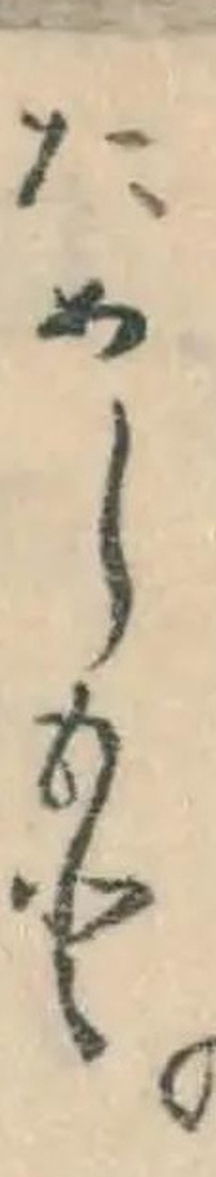ためしもや
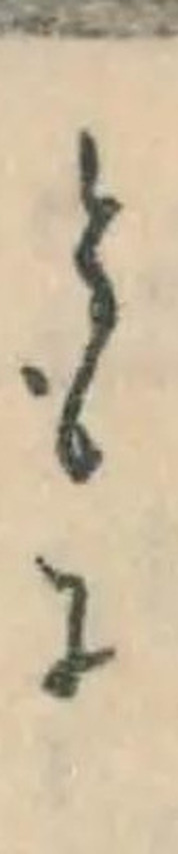ともに
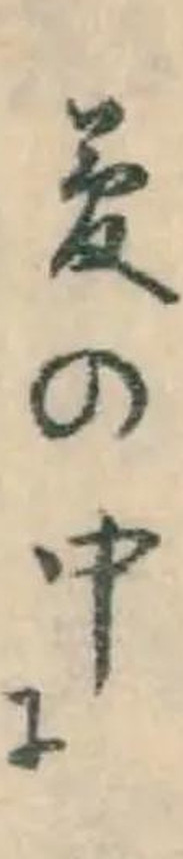夢の中に
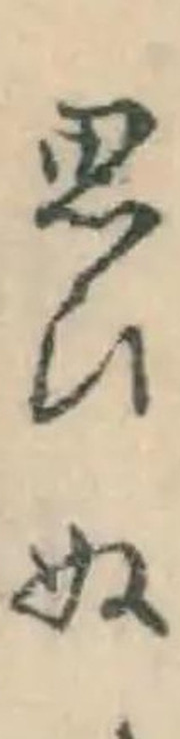思ひぬ

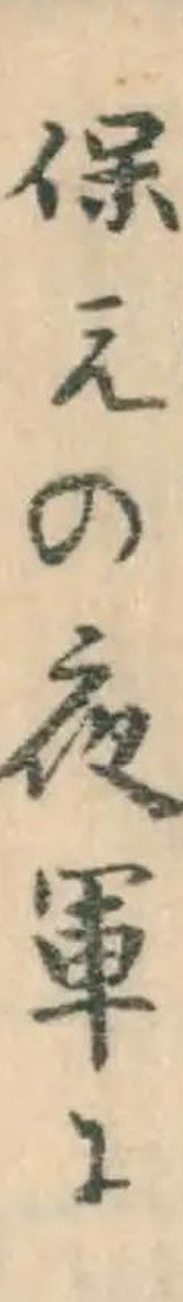保元の夜軍に
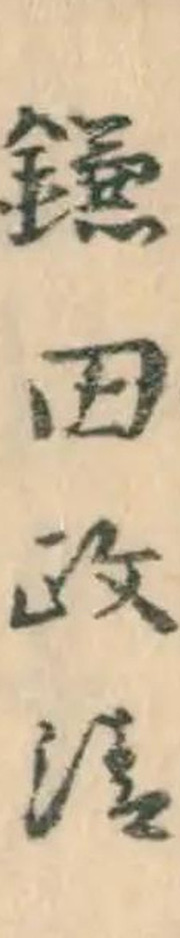鎌田政清
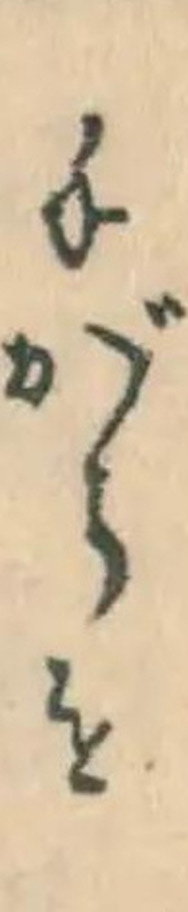手がらを
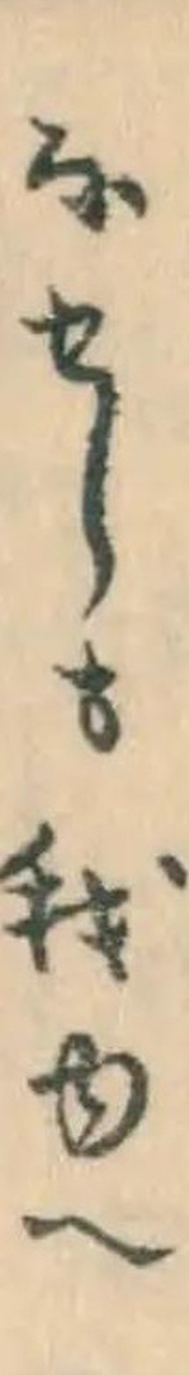なせしも我ゆへ
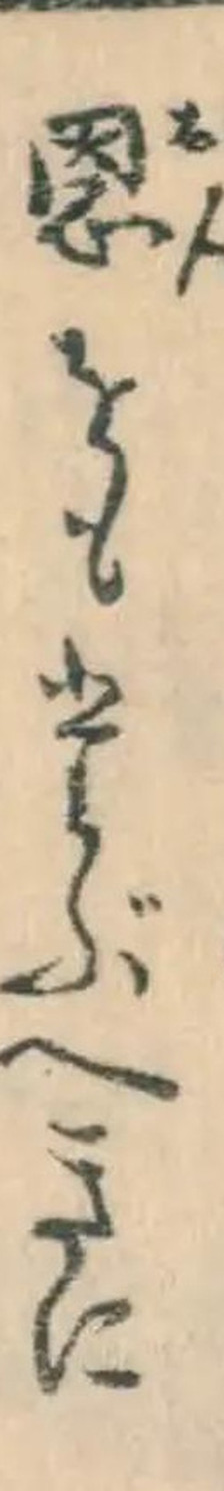恩をもたぶへきに
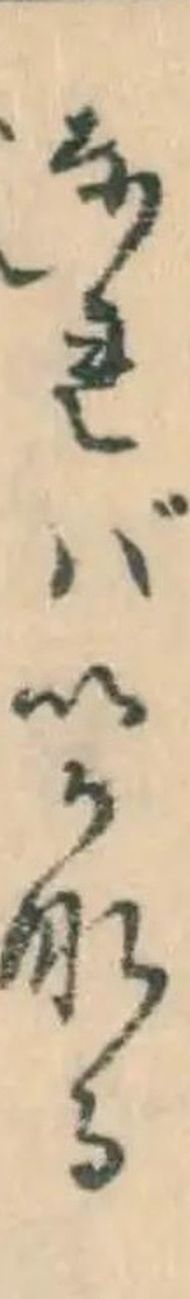なればいかなる
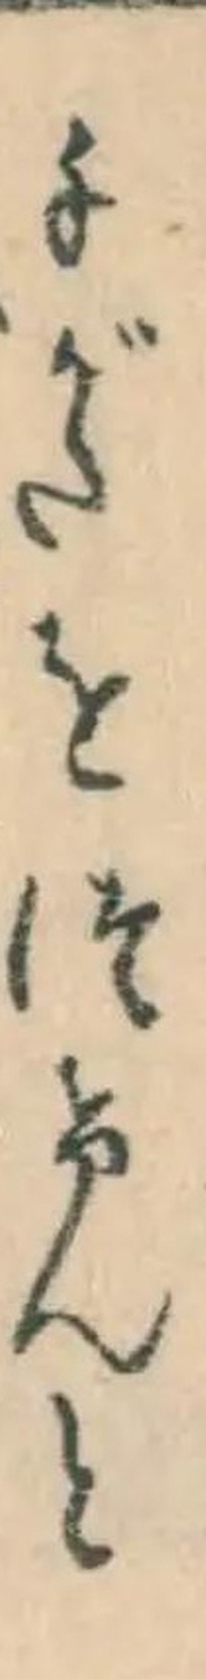手がたをつけんと
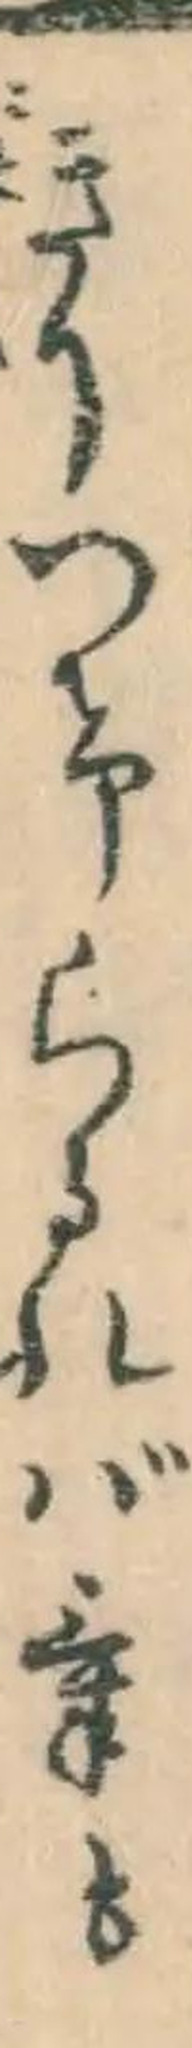きりつけらるれば氣も
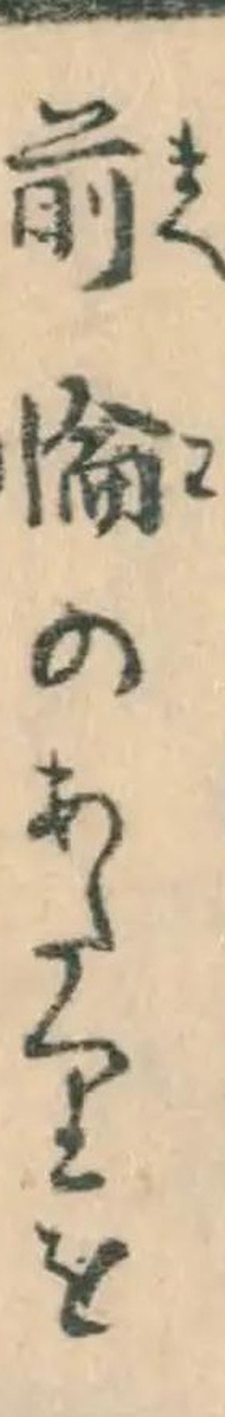前輪のあたりを
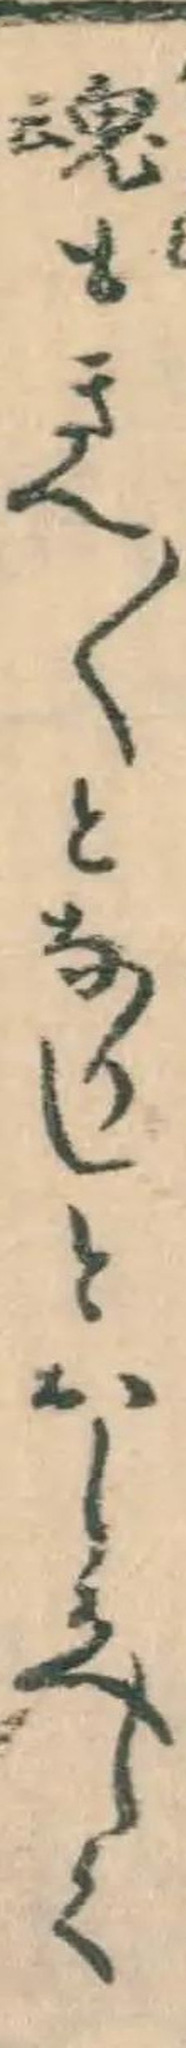魂もきへ〳〵となりしとおしかへして
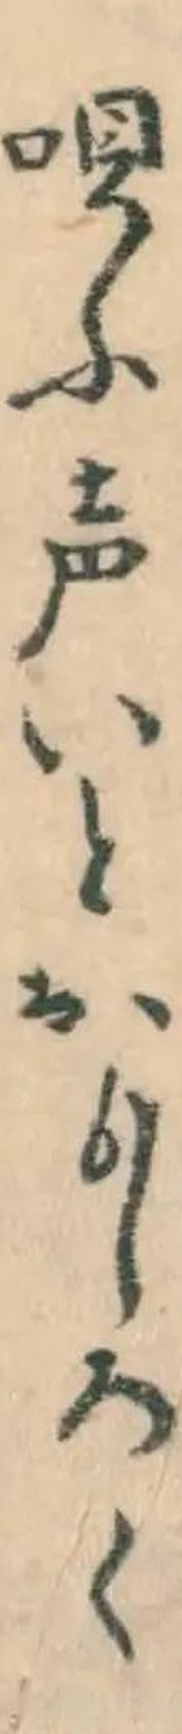唄ふ声いとおもしろく
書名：百鬼徒然袋 3巻. [2]
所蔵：国立国会図書館 National Diet Library, JAPAN
